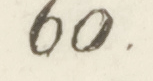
60.
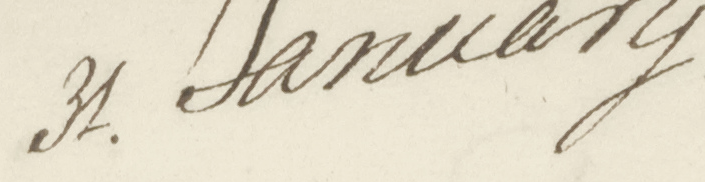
31. January.
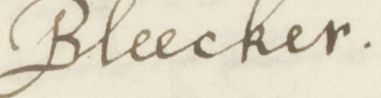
Bleecker.
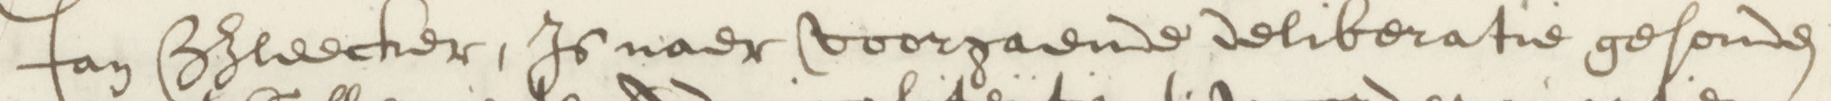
Jan Bleecker, Is naer voorgaende deliberatie gesonden
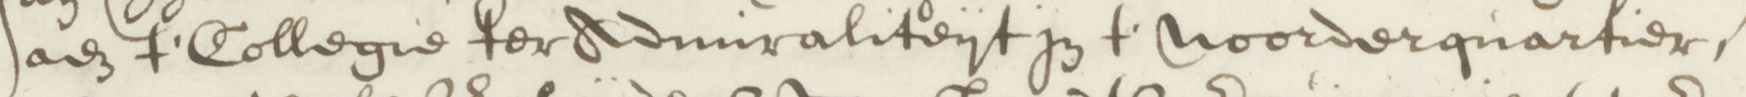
aen t'Collegie ter Admiraliteijt in t'Noorderquartier,
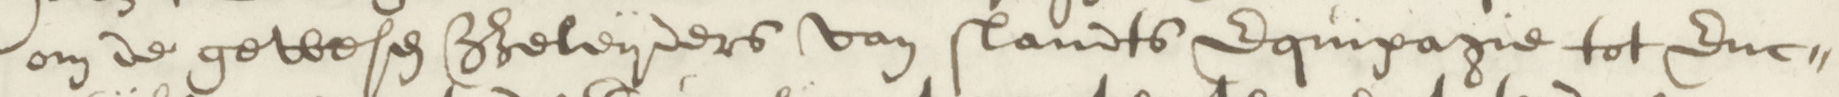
om de gewesen Beleijders van slandts Equipagie tot Enc„
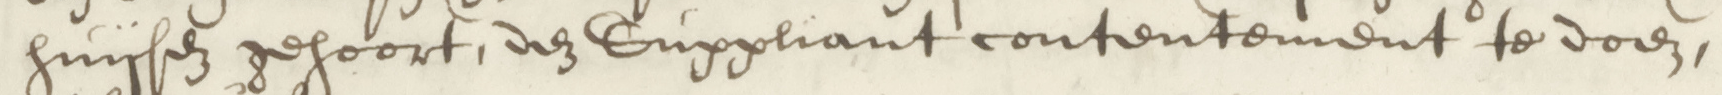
huijsen gehoort, den Suppliant contentement te doen.
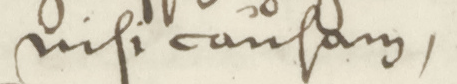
Nisi causam.
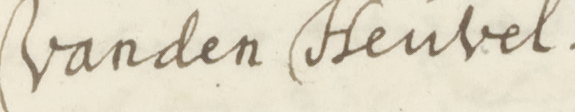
Vanden Heuvel
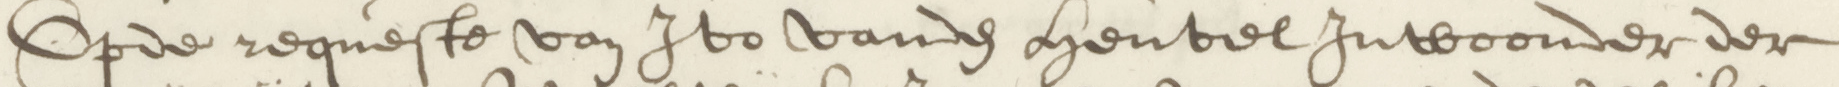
Opde requeste van Ivo vanden Heuvel Inwoonder der
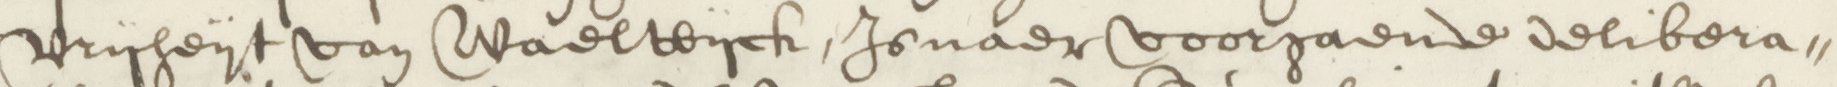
Vrijheijt van Waelwijck, Is naer voorgaende delibera„
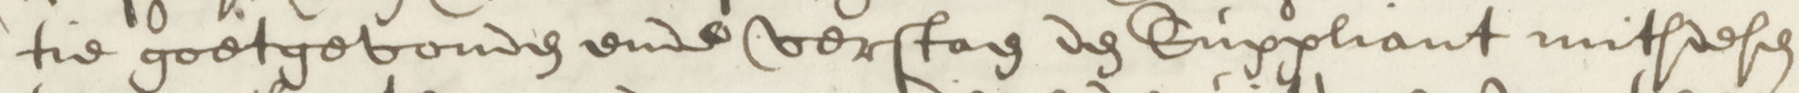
tie goetgevonden ende verstaen den Suppliant mitsdesen
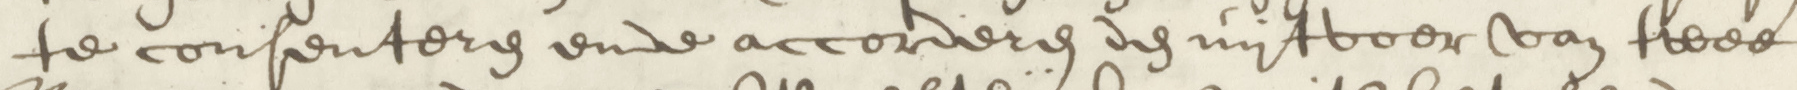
te consenteren ende accorderen den uijtvoer van twee
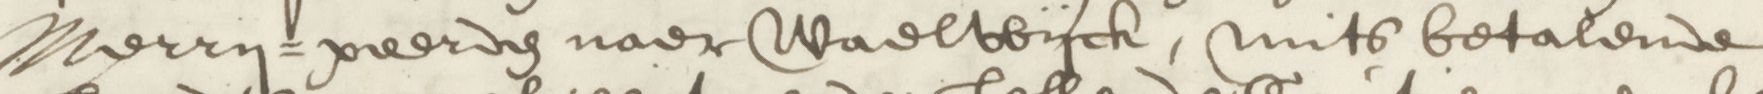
Merrij=peerden naer Waelwijck, mits betalende
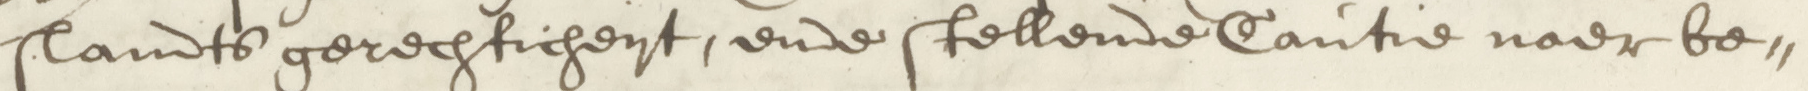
slandts gerechticheijt, ende stellende Cautie naer be„
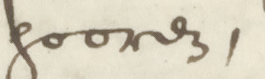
hooren.
